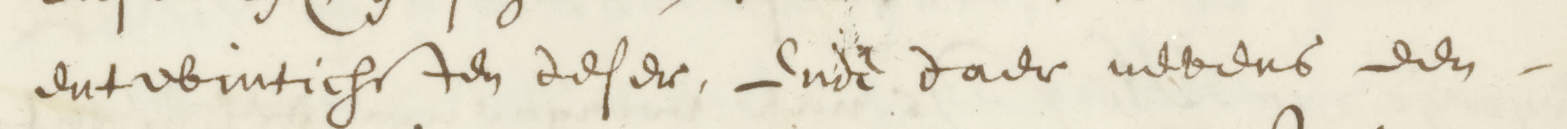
entwintichsten deser, Ende daer nevens een -
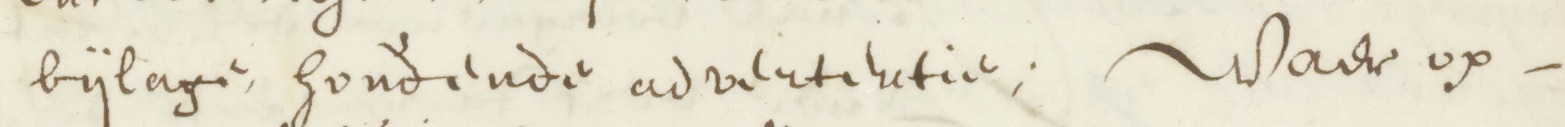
bijlage, houdende advertentie; Waer op
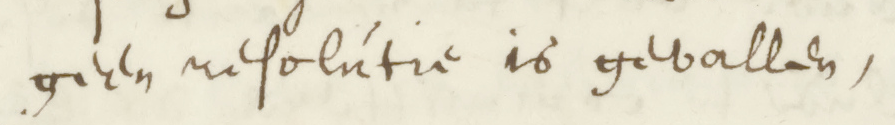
geen resolutie is gevallen.
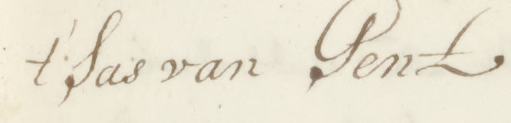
t' Sas van Gent
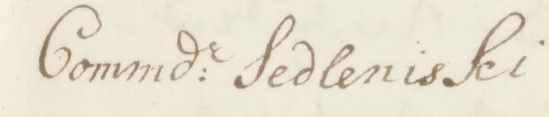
Commdr: Sedleniski
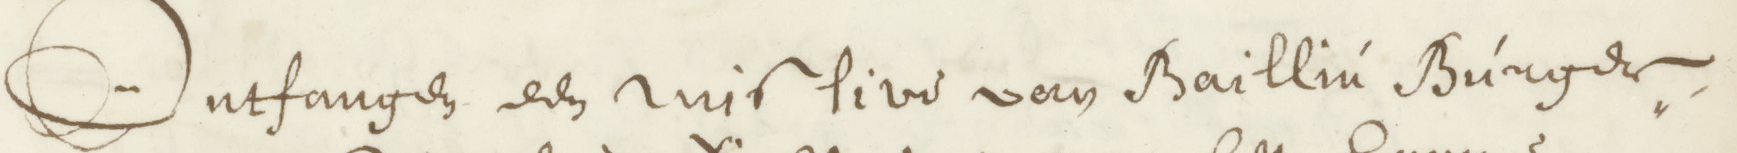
Ontfangen een missive van Bailliu Burger„
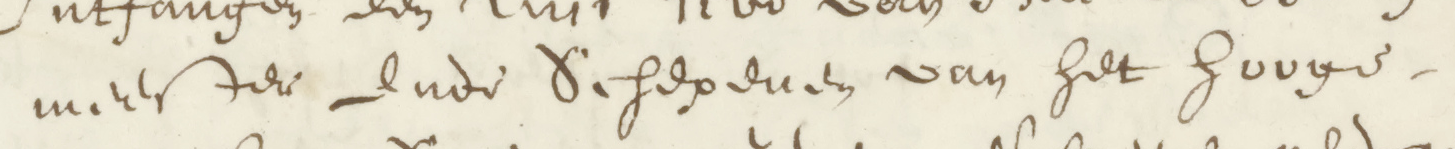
meester ende Schepenen van het Hooge -
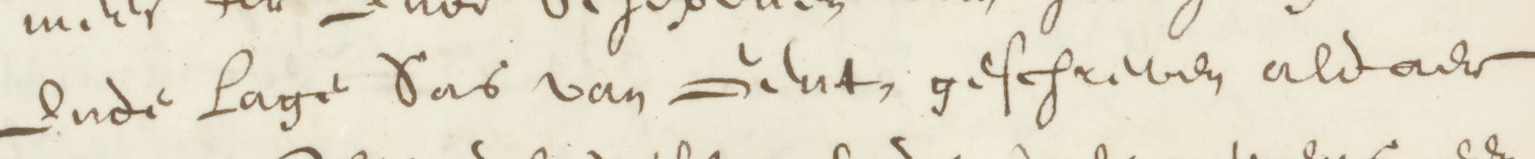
ende Lage Sas van Gent, geschreven aldaer
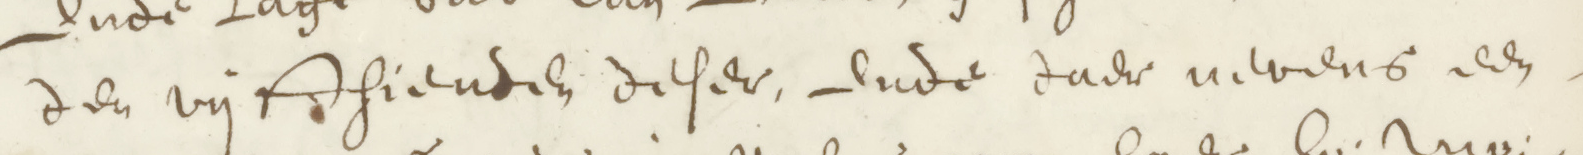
den vijfthienden deser, ende daer nevens een
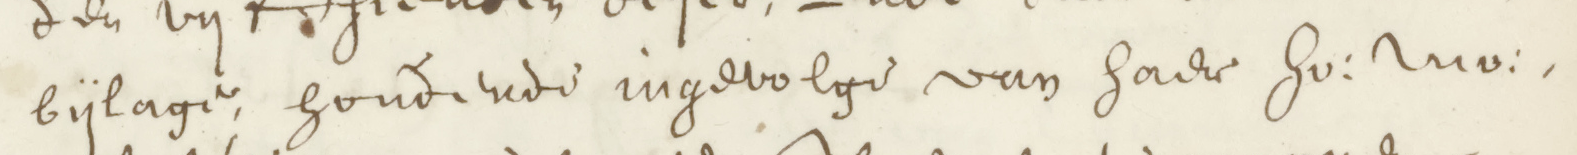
bijlage, houdende ingevolge van haer ho:Mo:
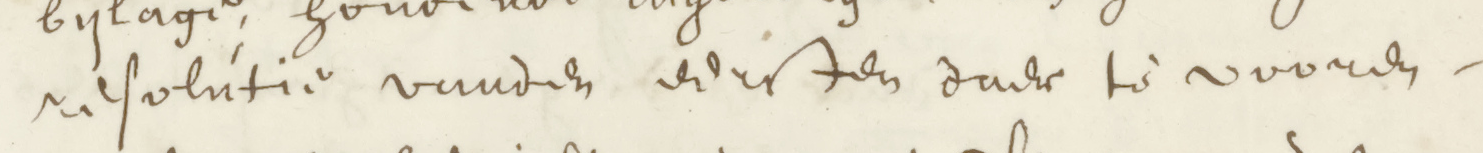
resolutie vanden eersten daer te vooren
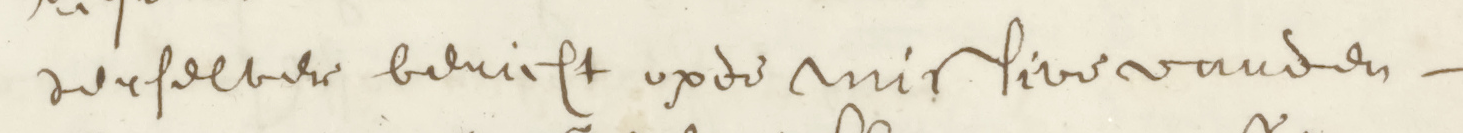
derselver bericht opde missive vanden—
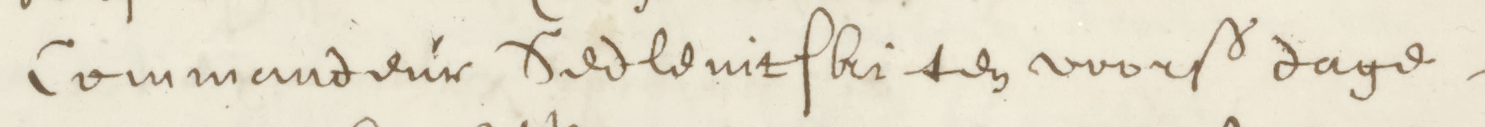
Commandeur Sedlenitski ten voors dage
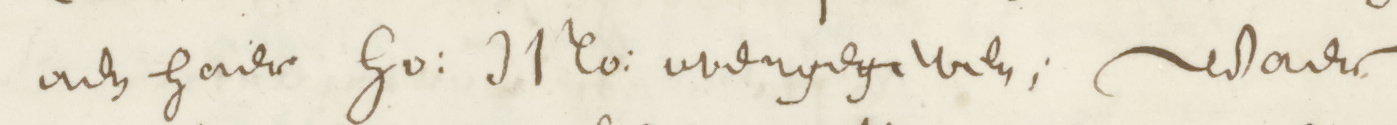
aen haer Ho:Mo: overgegeven; Waer
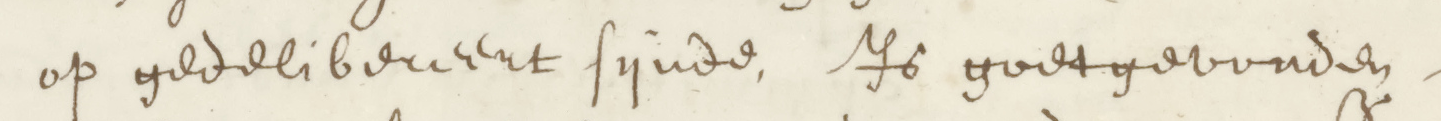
op gedelibereert sijnde, Is goetgevonden
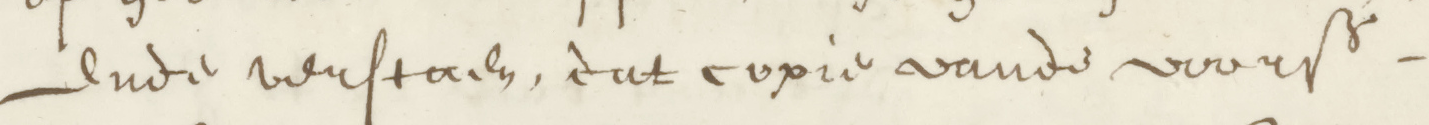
ende verstaen, dat copie vande voors
